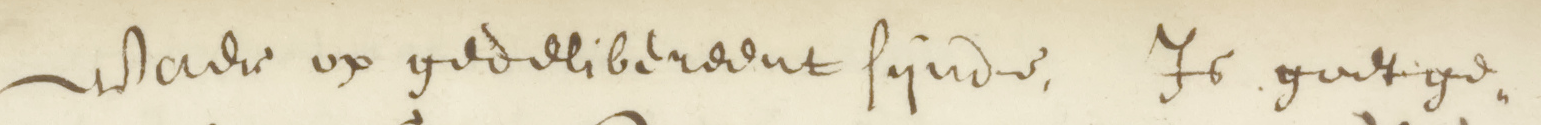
Waer op gedelibereert sijnde, Is goetge„
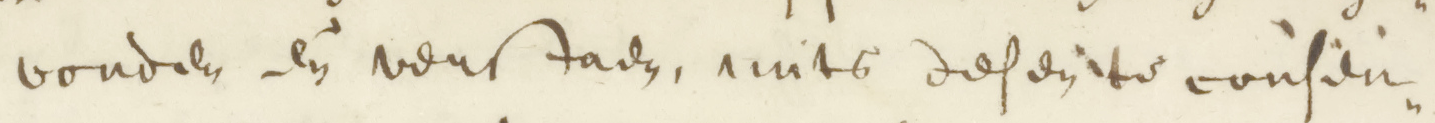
vonden en verstaen, mits desen te consen„
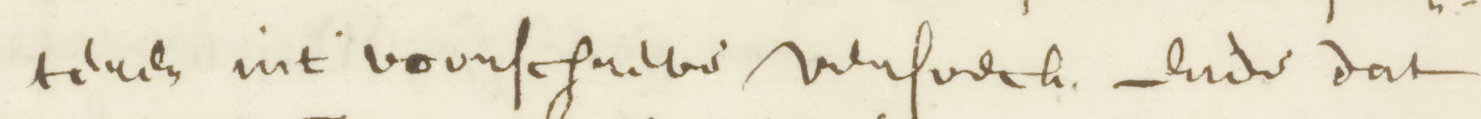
teren int' voorschreve versoeck ende dat
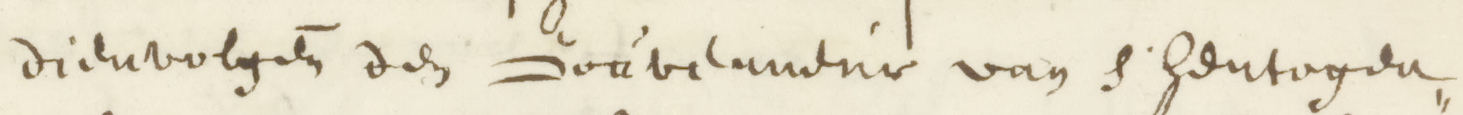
dienvolgen den Gouverneur van s'Hertogen„
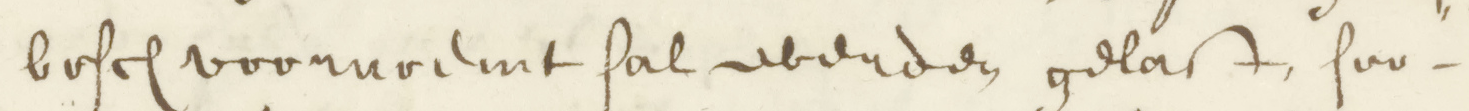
bosch voornoemt sal werden gelast, soo
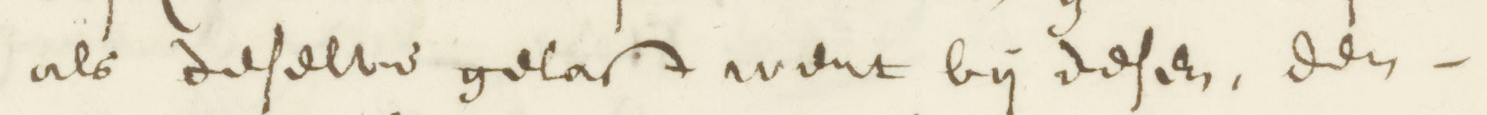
als deselve gelast wert bij desen, den -
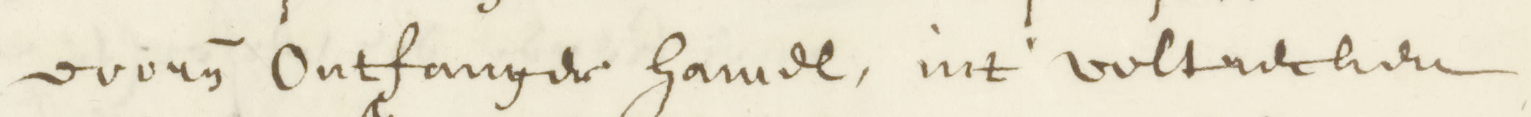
voorn Ontfanger Hamel, int‛ voltrecken
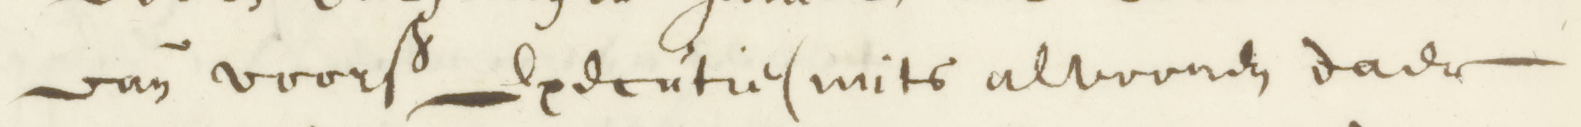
van voors executie (mits alvooren daer
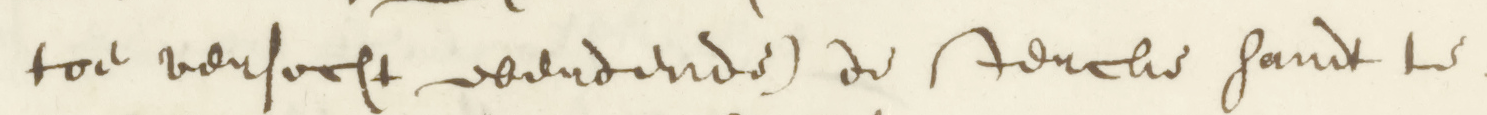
toe versocht werdende) de stercke handt te
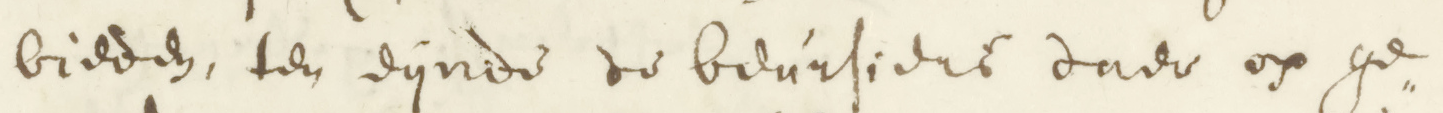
bieden, ten eijnde de beursiers daer op ge„
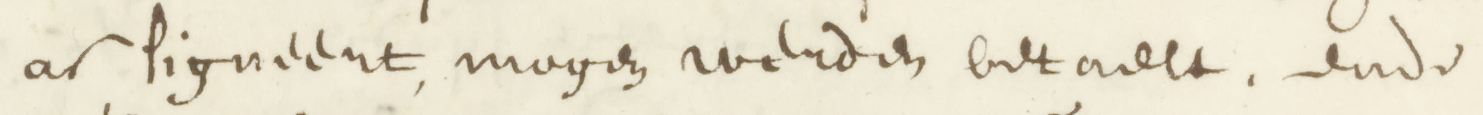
assigneert, mogen werden betaelt, ende
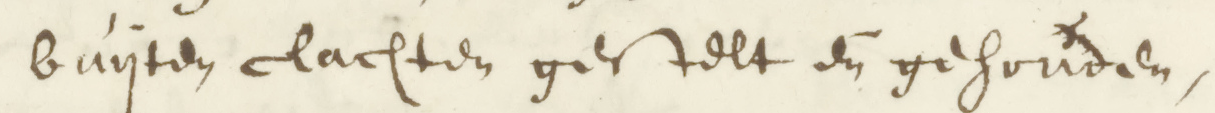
buijten clachten gestelt en gehouden.
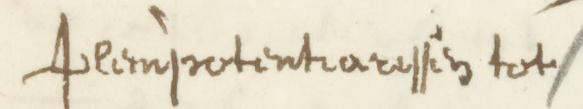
Plenipotentiarissen tot
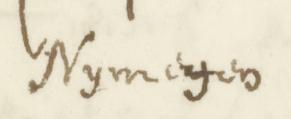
Nijmegen
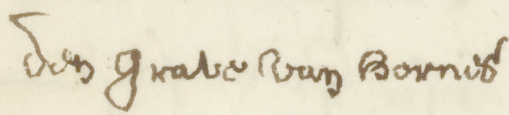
den Grave van Hornes
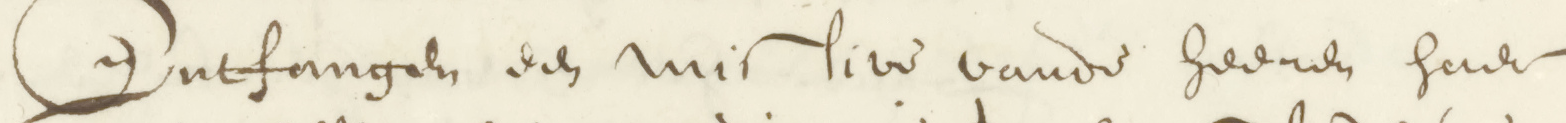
Ontfangen een missive vande heeren haer
